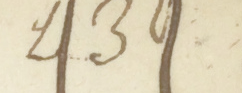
439
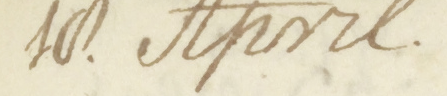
18. April.
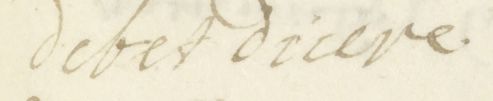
debet dicere
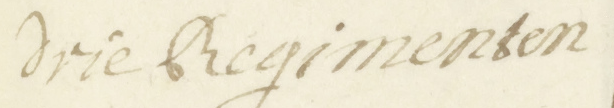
drie Regimenten.
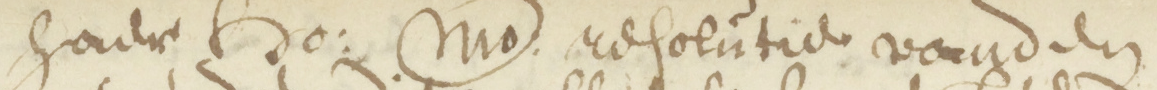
haer Ho:Mo: resolutie vanden
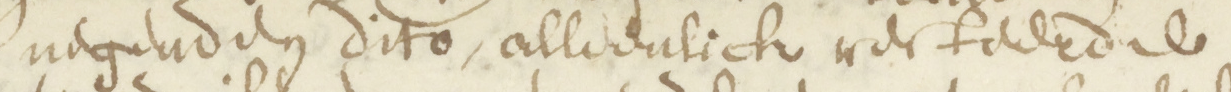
negenden dito, alleenlick resteerde
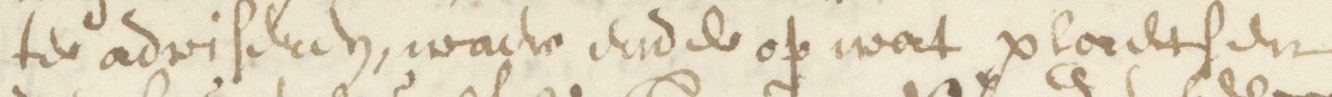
te adviseren, waer ende op wat plaetsen
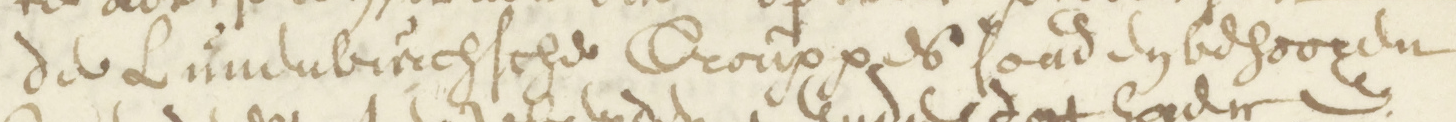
de Lunenburchsche Trouppes souden behooren
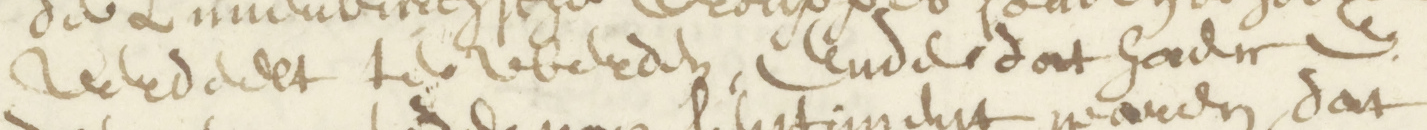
verdeelt te werden, ende dat haer E.
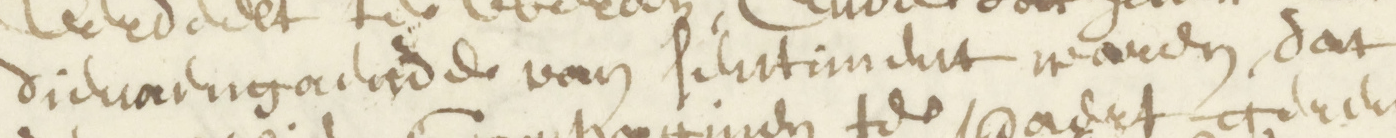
dienaerngaende van sentiment waren, dat
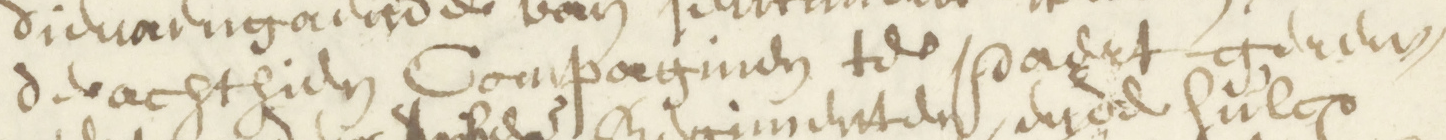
de achthien Compagnien te paert geren,,
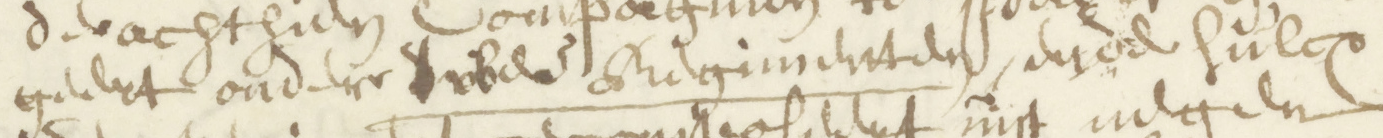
geert onder twee Regimenten, ende sulcx
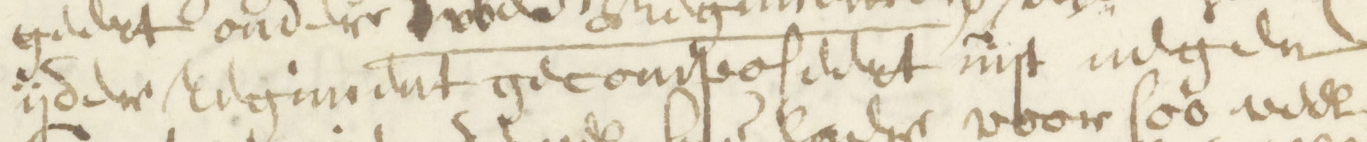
ijder regiment gecomposeert uijt negen
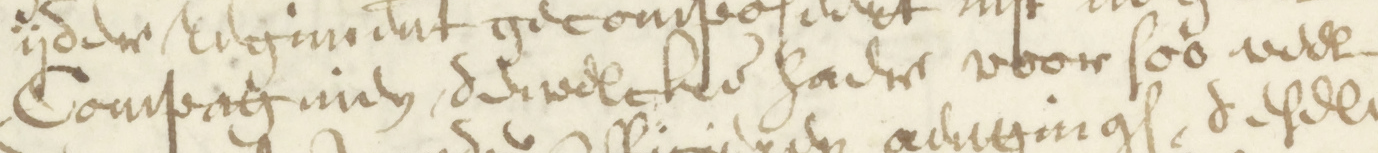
Compagnien, denwelcke haer voor soo veel
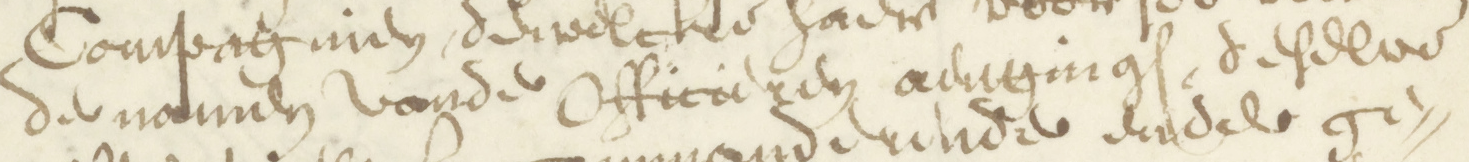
de namen vande Officieren aengingh, deselve
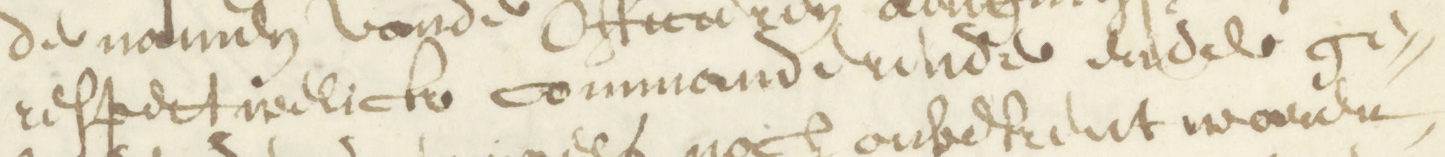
respectivelick commanderende ende ge,,
